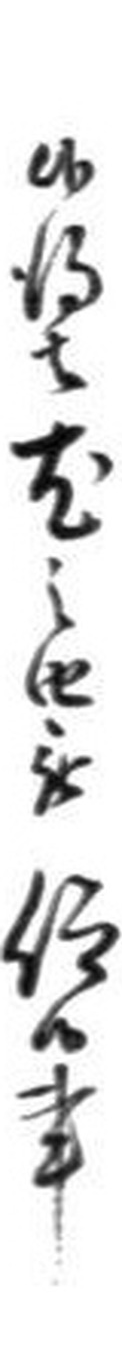候得者尤之由被仰候事
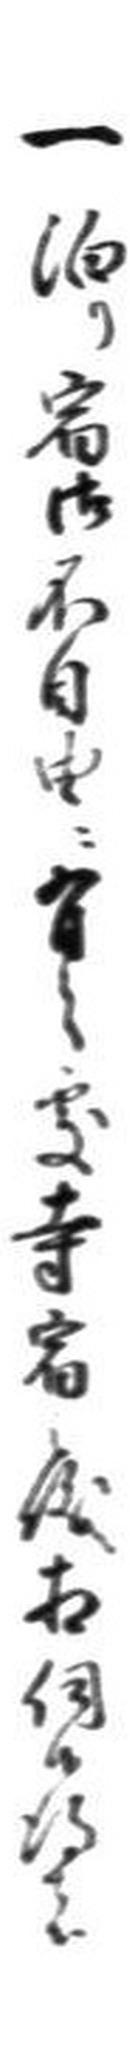一泊り宿御不自由ニ有之処寺宿之儀相伺候得者
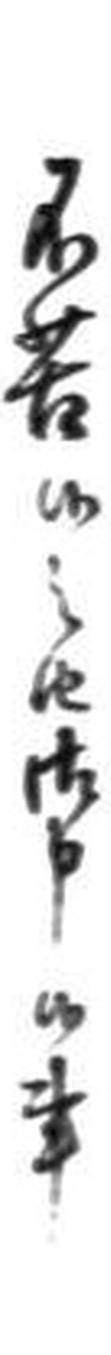不苦候之由御申候事
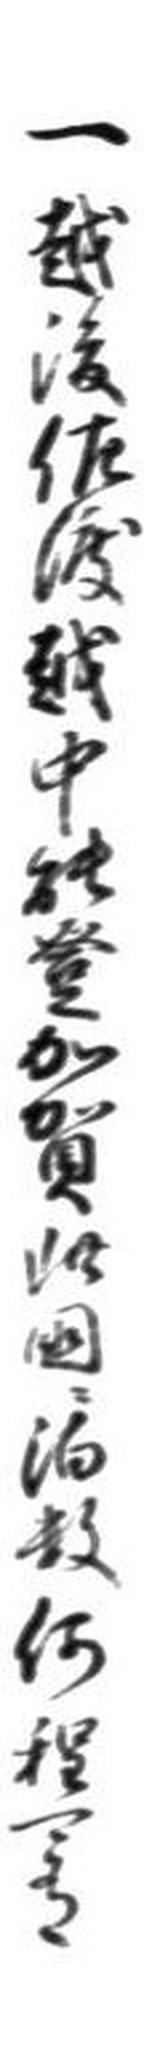一越後佐渡越中能登加賀此国ニ泊数何程可有
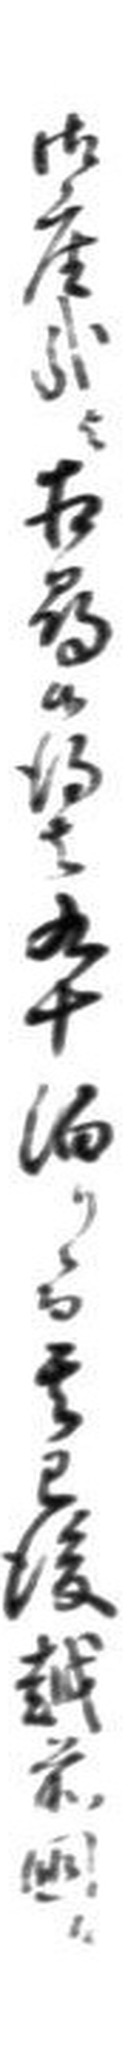御座哉与相尋候得者九十泊りニ而其已後越前国江
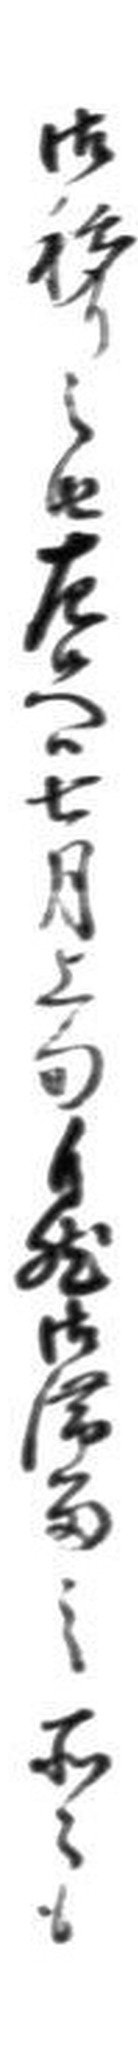御移り之由左候ヘハ七月上旬自然御滞留之所々も
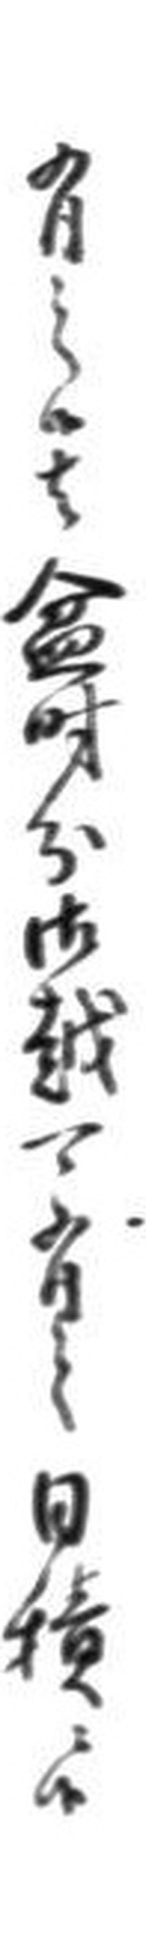有之候者盆時分御越可有之日積ニ候之

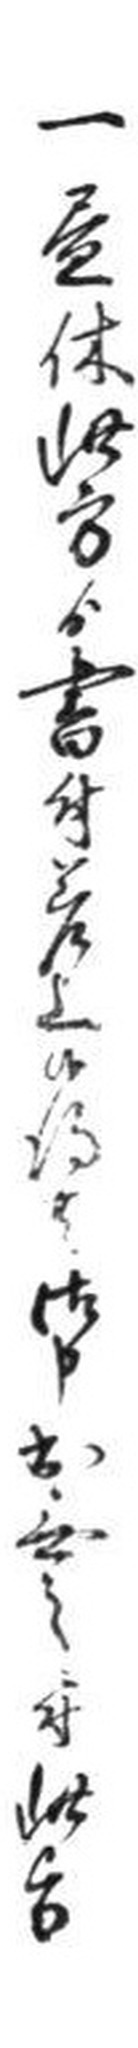一昼休此方ゟ書付差上候得共御申出無之ニ付此旨
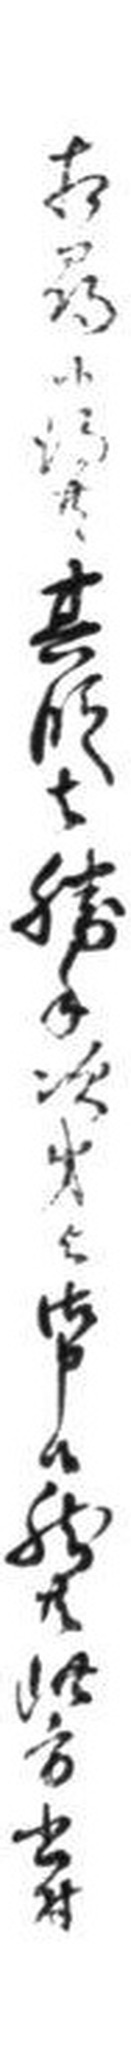相尋候得共其段者勝手次第と御申候然共此方書付
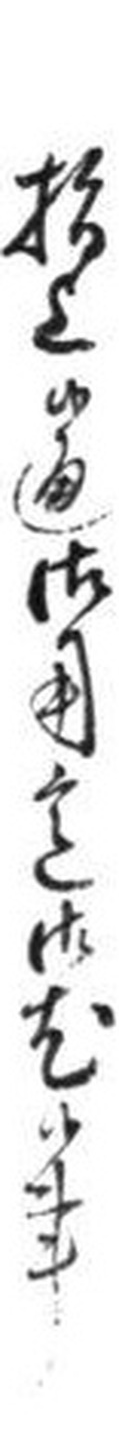指上候通御用意御尤候事
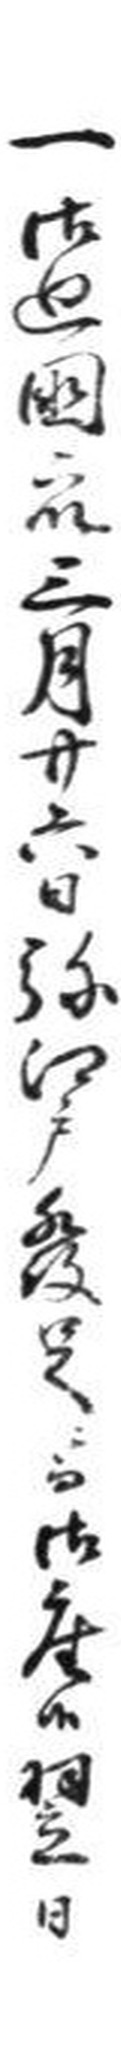一御廻国衆三月廿六日弥江戸発足ニ而御座候翌日
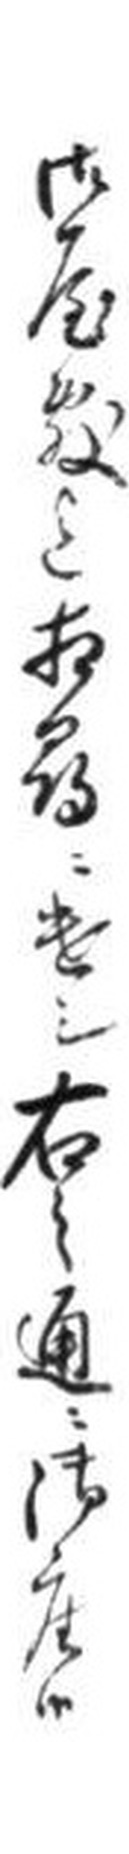御屋敷迄相尋ニ遣シ右之通ニ御座候
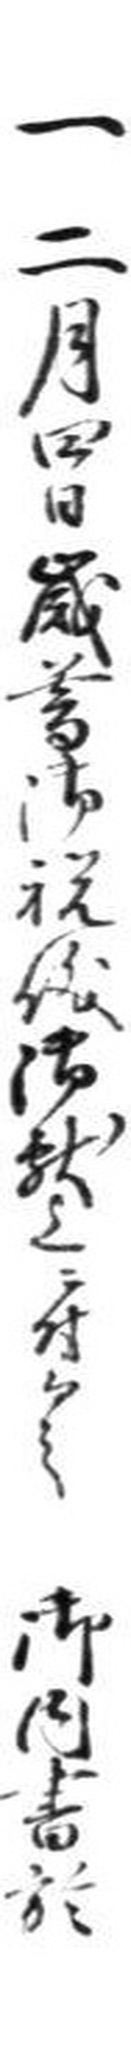一二月四日歳暮御祝儀御献上ニ付而之御内書於
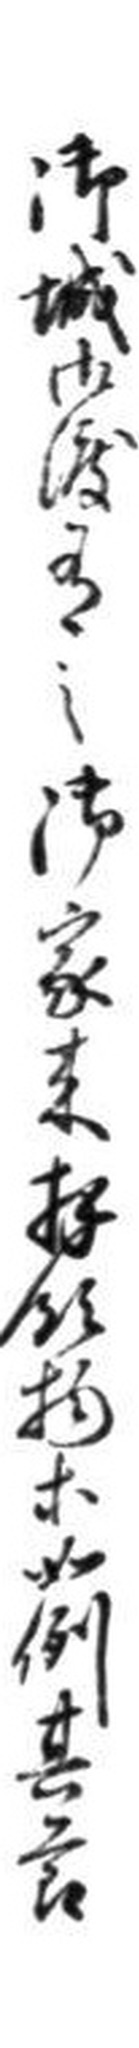御城御渡有之御家来拝領物等如例其節
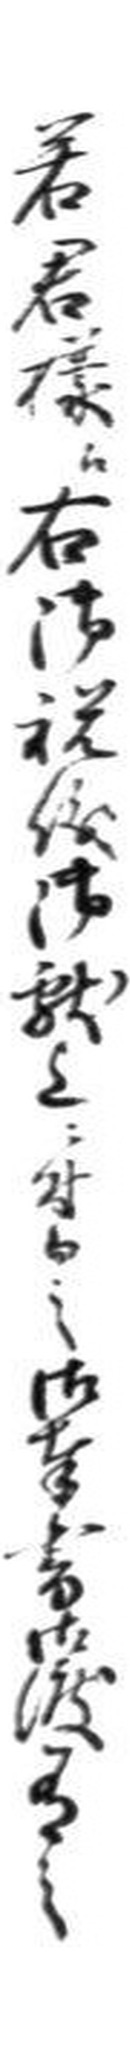若君様江右御祝儀御献上ニ付而之御奉書御渡有之
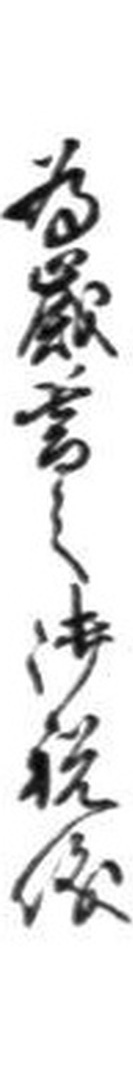為歳暮之御祝儀
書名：家譜 十五 綱昌公 従天和元年到元禄十二年
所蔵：福井県文書館 Fukui Prefectural Archives
